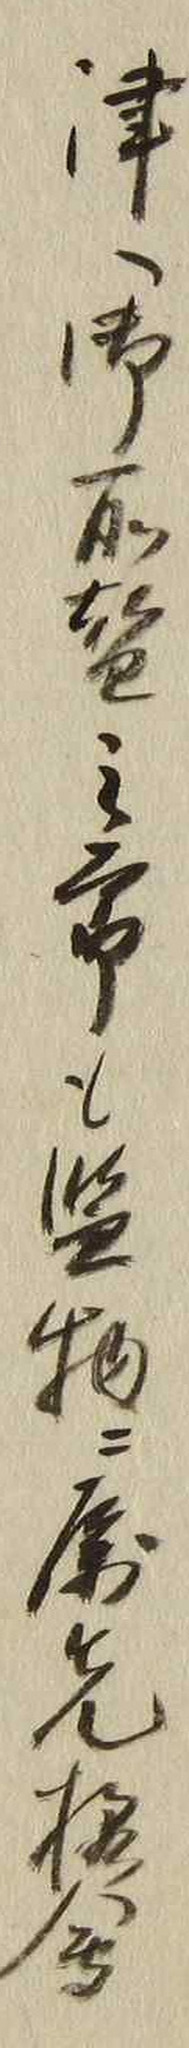津へ御所替之節も監物に属先様会
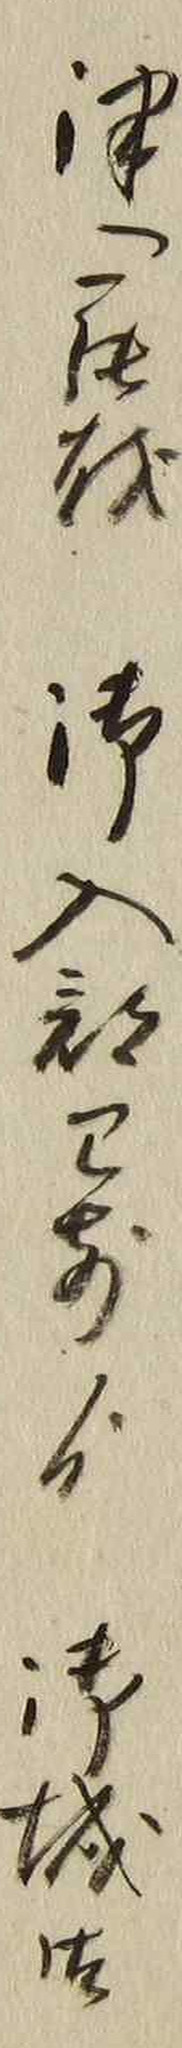津へ罷越御入部已前ゟ御城御
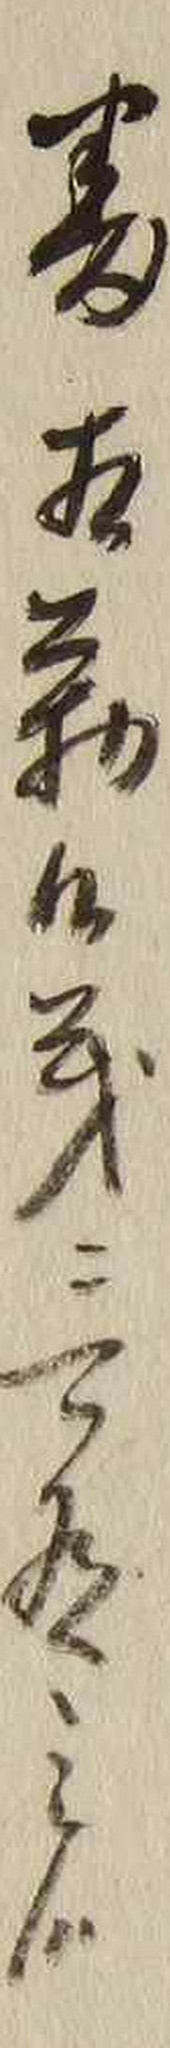番相勤候義に可有之候
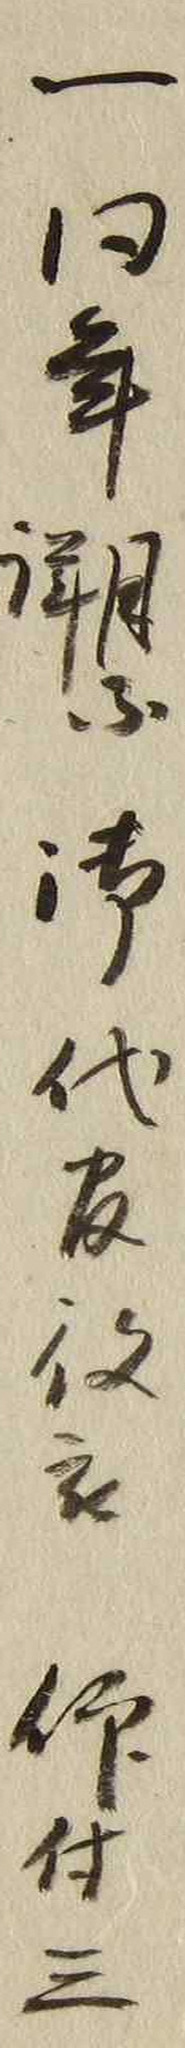一同年詳御代官役被仰付三
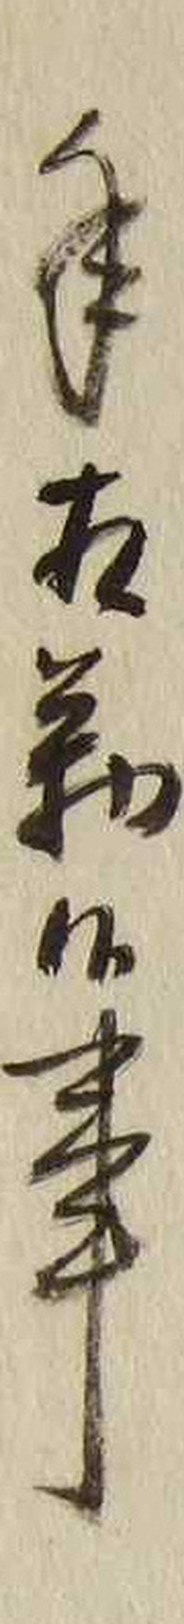年相勤候事
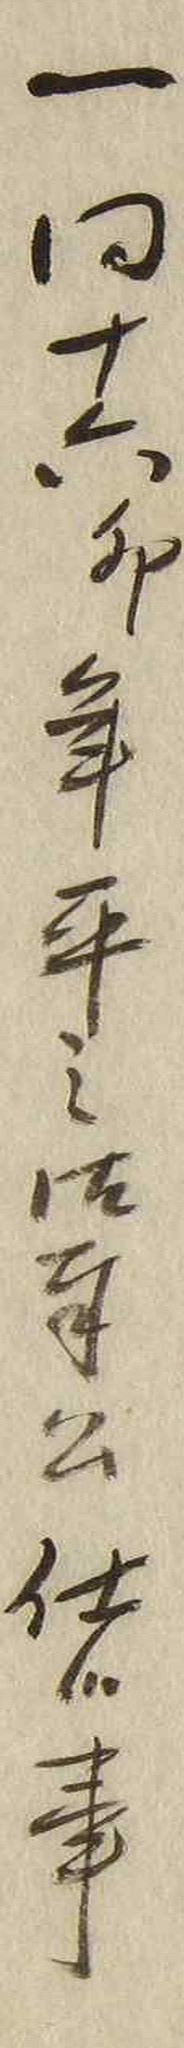一同十六卯年平之御奉公仕候事

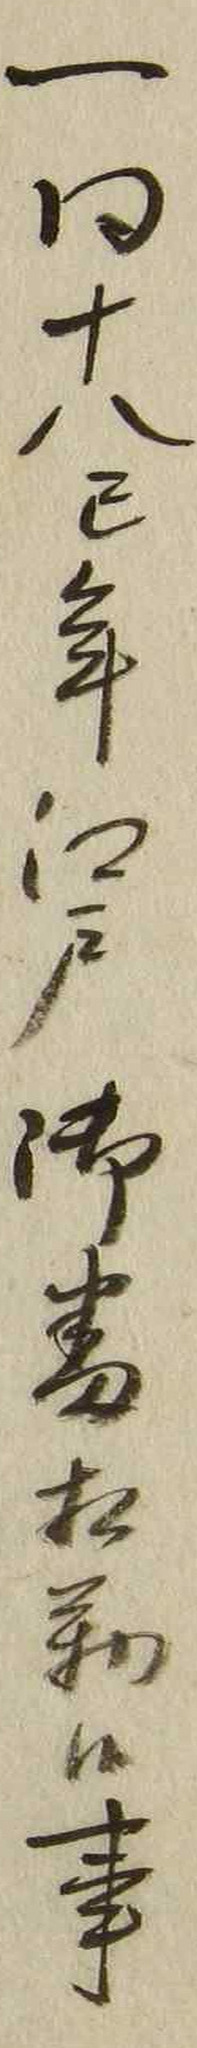一同十八巳年江戸御番相勤候事
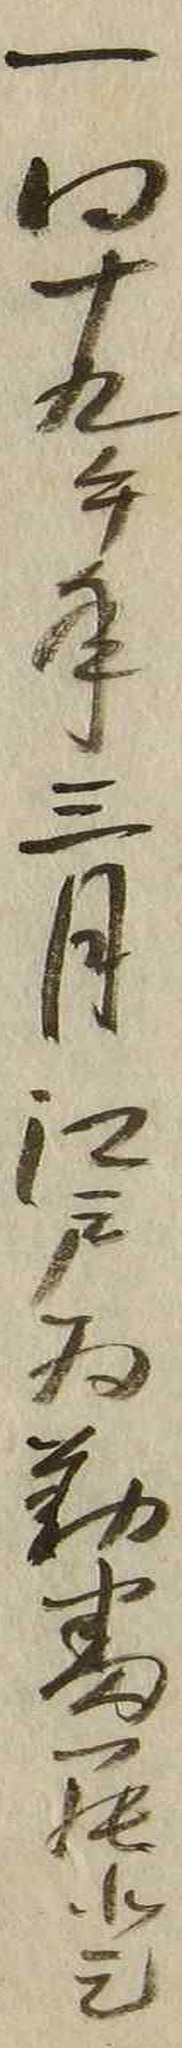一同十九午年三月江戸為勤番罷登
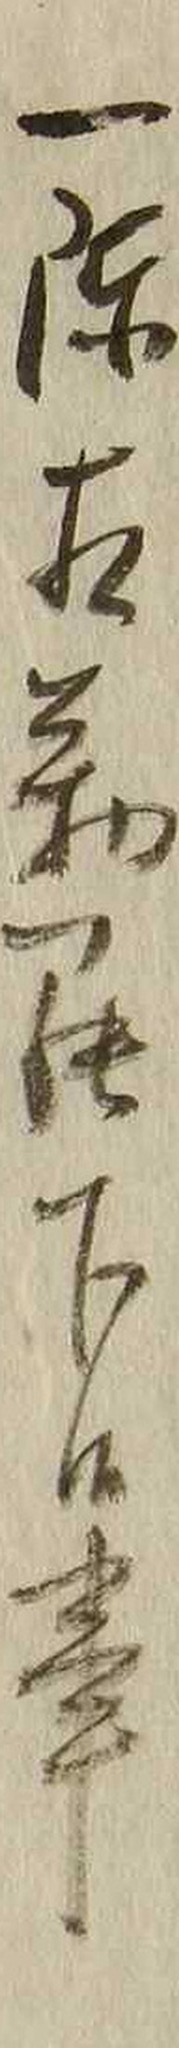一陣相勤罷下候事
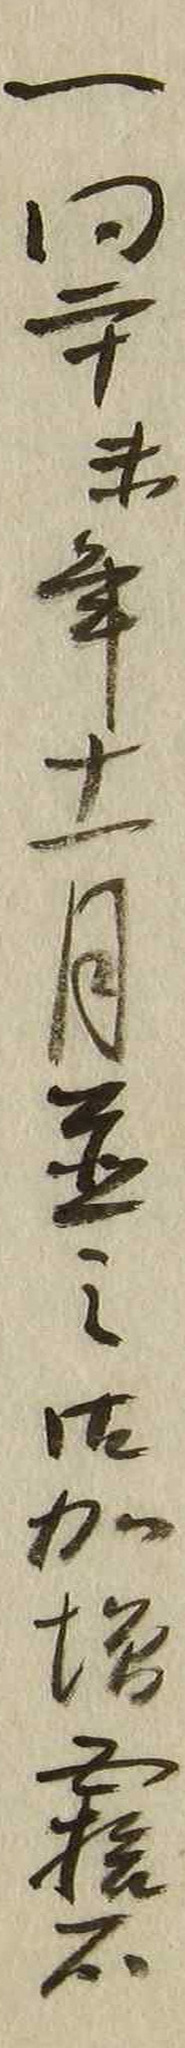一同二十未年十一月並之御加増五拾石
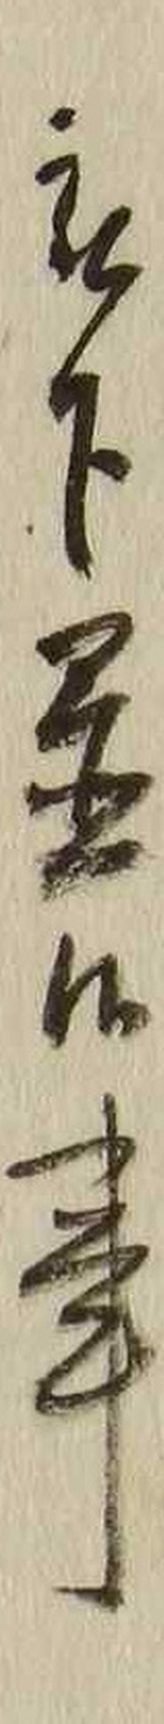被下置候事
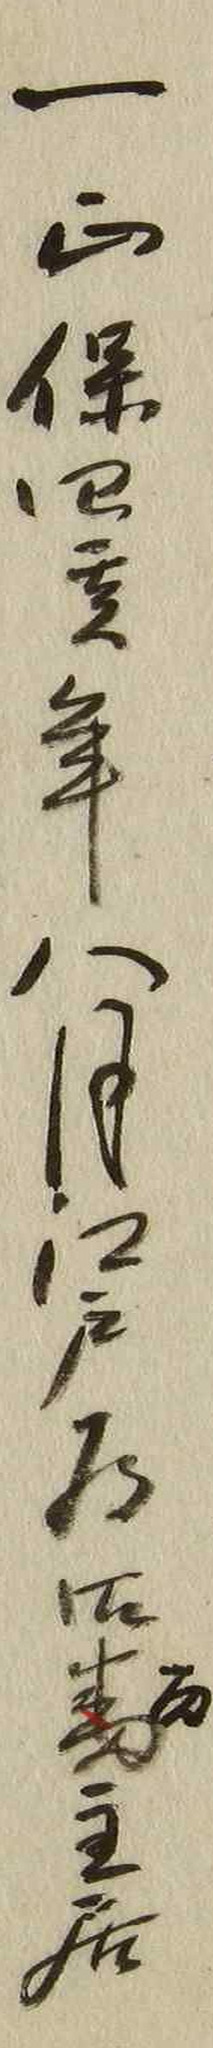一正保四亥年八月江戸為御番守居
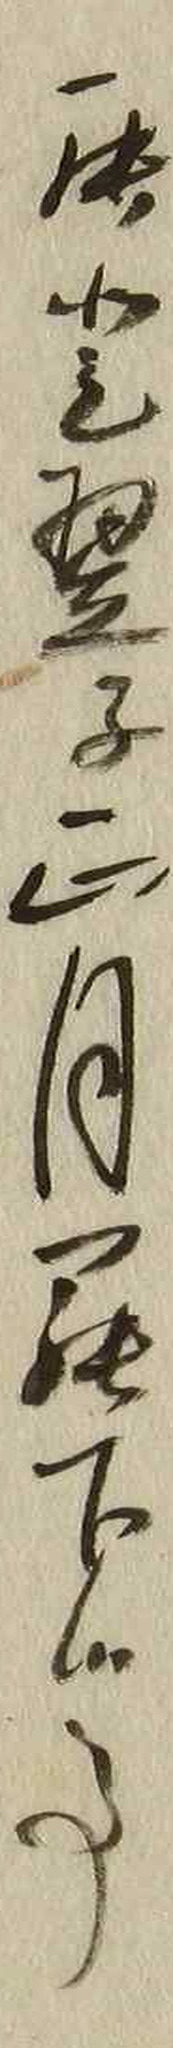罷登翌子正月罷下候事
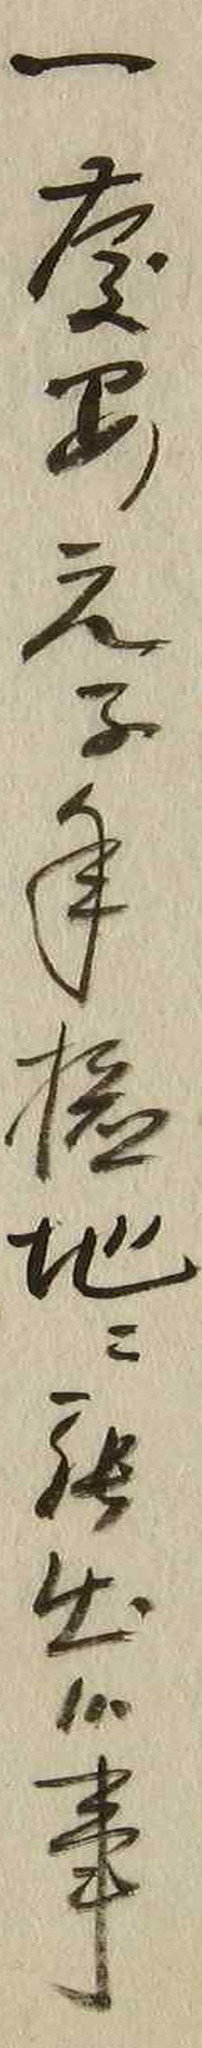一慶安元子年検地に罷出候事
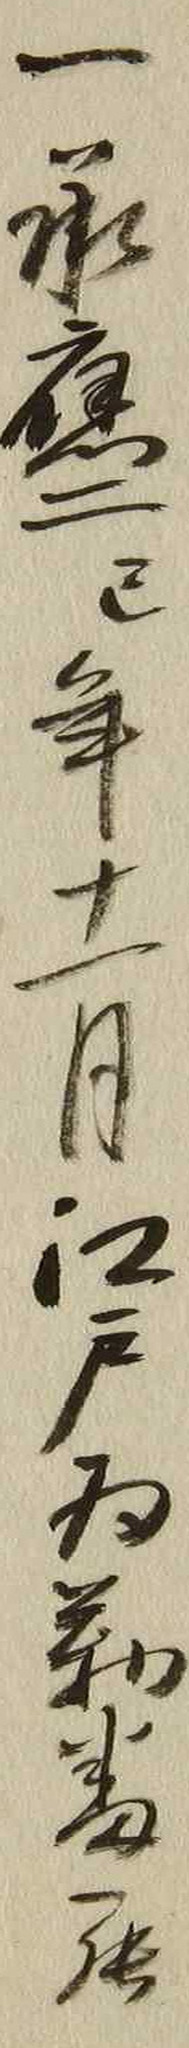一承応二巳年十一月江戸為勤番罷
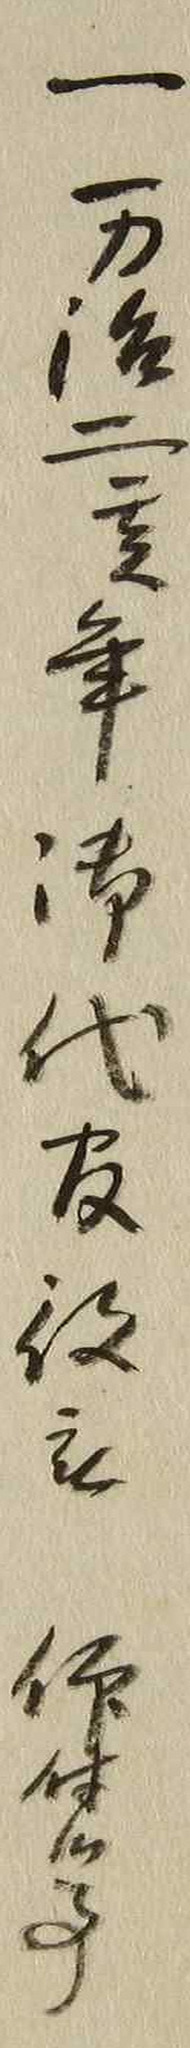一万治二亥年御代官役被仰付候事
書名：諸士系譜　巻之360　す之部10
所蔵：会津若松市立会津図書館
